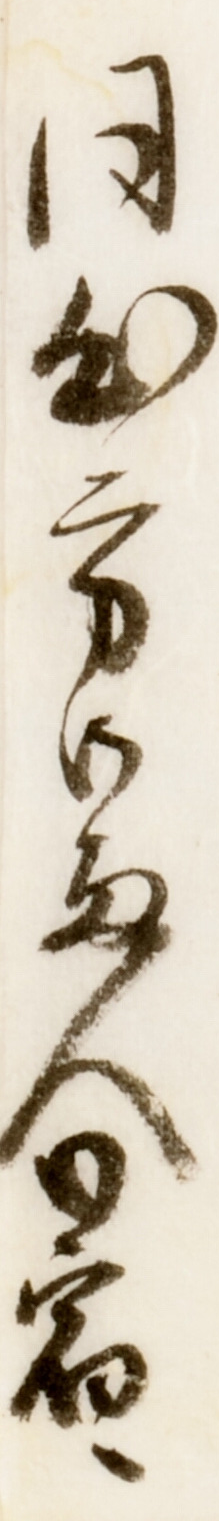同心方御両人御宿へ
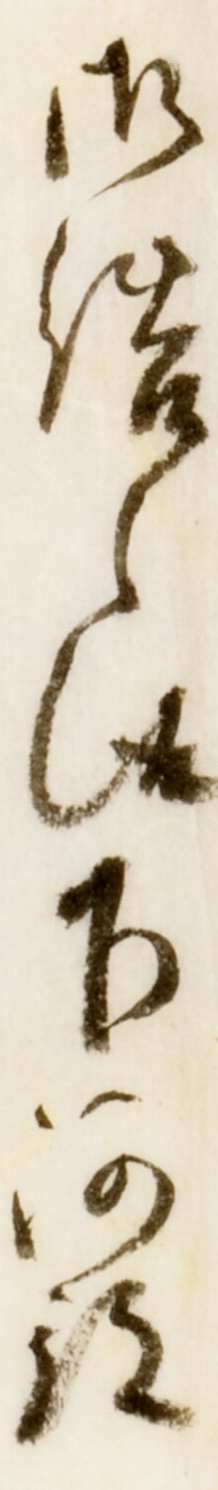御詰之趣下河部
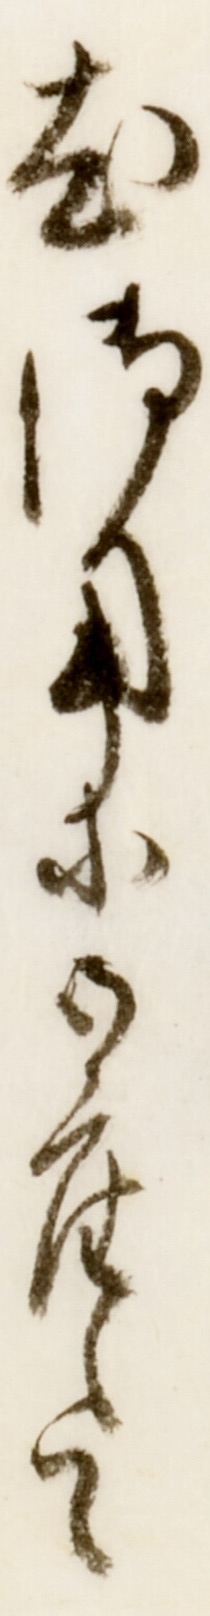尤御用等御座候はゝ
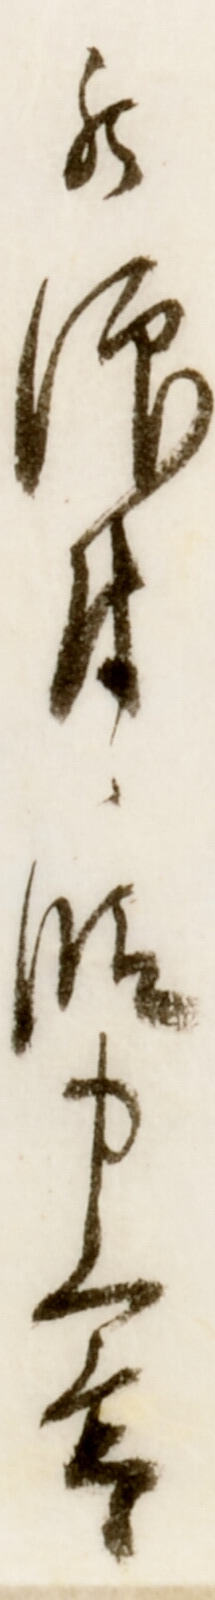被仰付候段申上置候
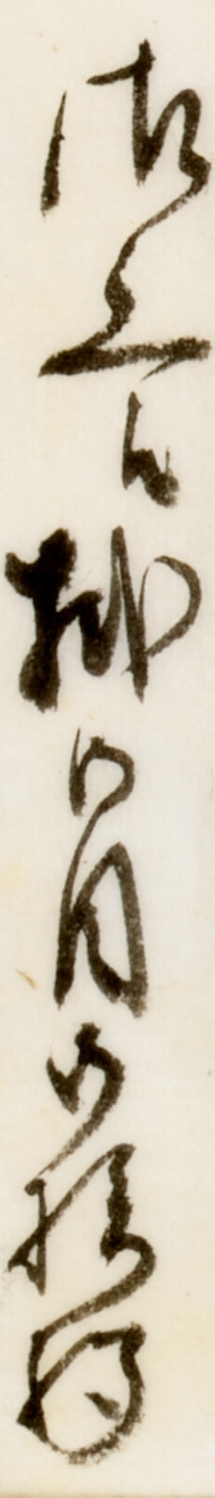御上江掛御目御挨拶
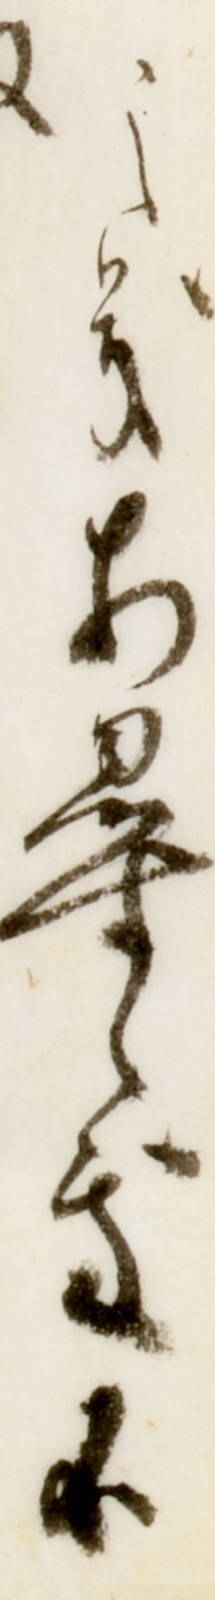之義相尋候處不

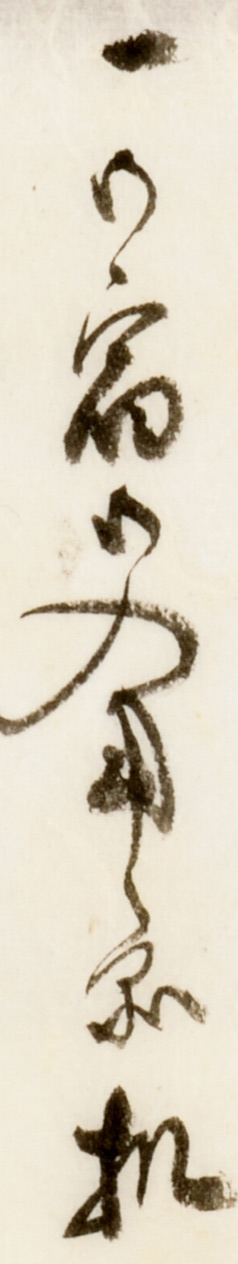一御宿御入用之品机
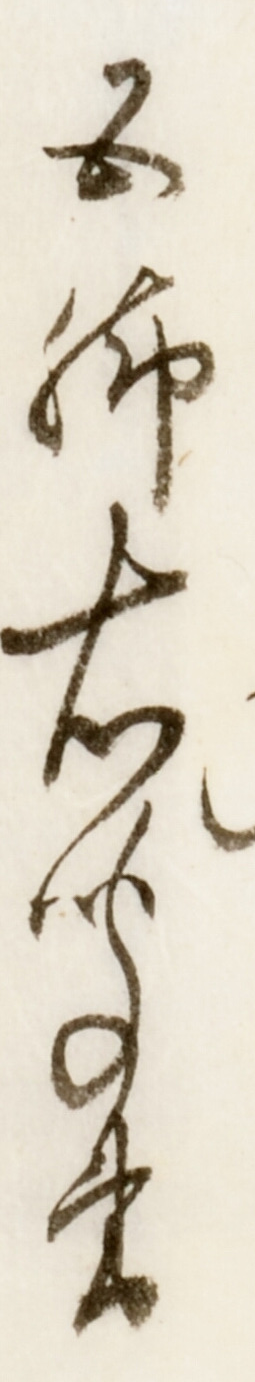五脚右聞書
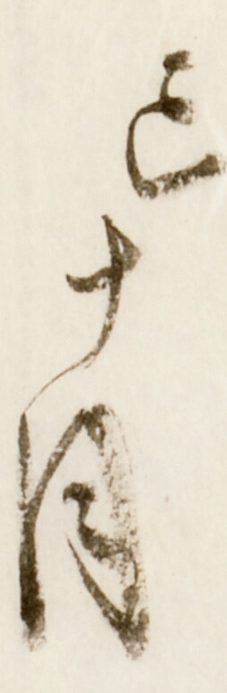巳十月
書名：覚
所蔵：伊那市立高遠町図書館・合同会社AMANE
